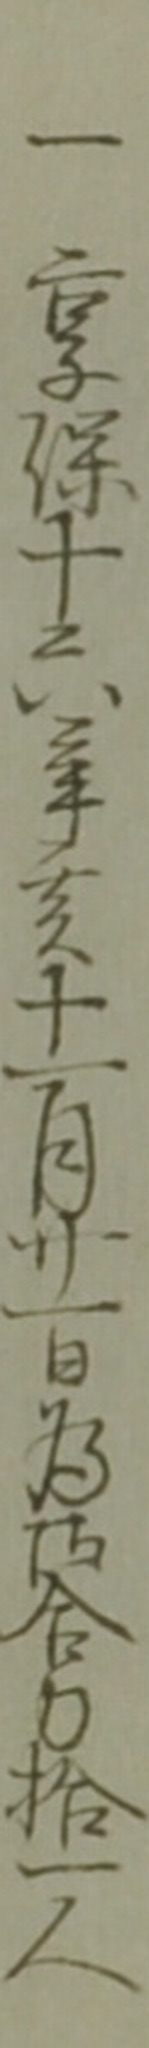一享保十六辛亥十一月廿一日為御合力拾一人
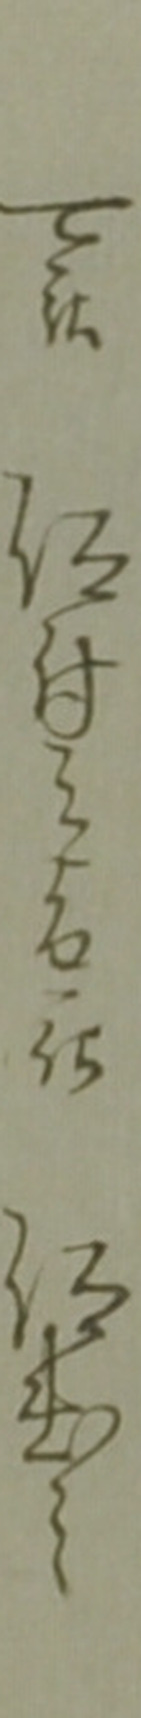可被仰付之旨被仰出之
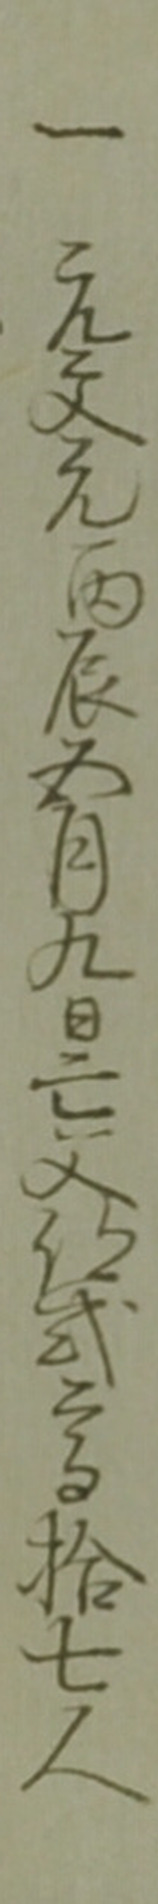一元文元丙辰五月九日亡父跡式高拾七人
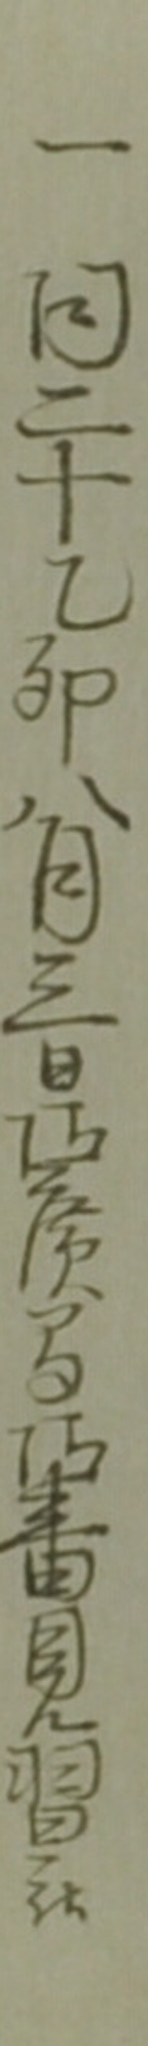一同二十乙卯八月三日御広間御番見習被
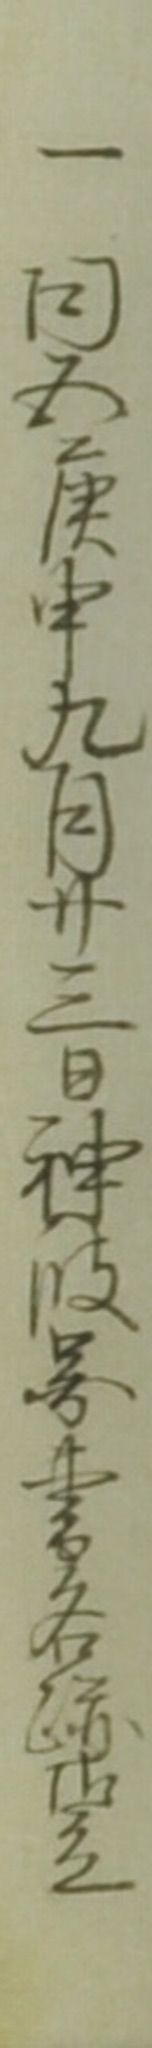一同五庚申九月廿三日神波図書名跡御立
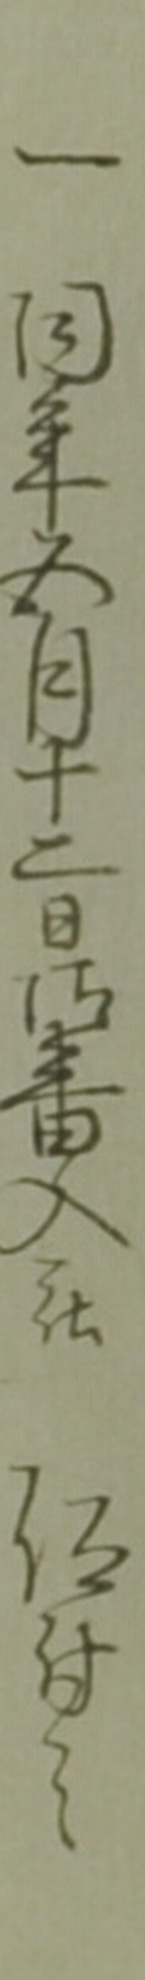一同年五月十二日御番入被仰付之
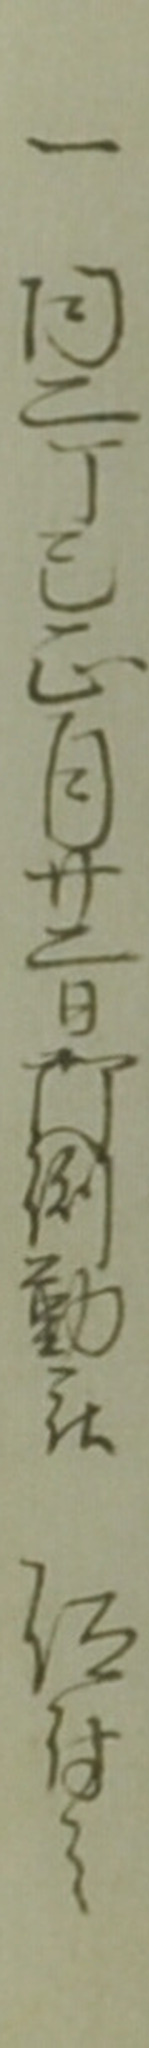一同二丁巳正月廿ニ日御側勤被仰付之

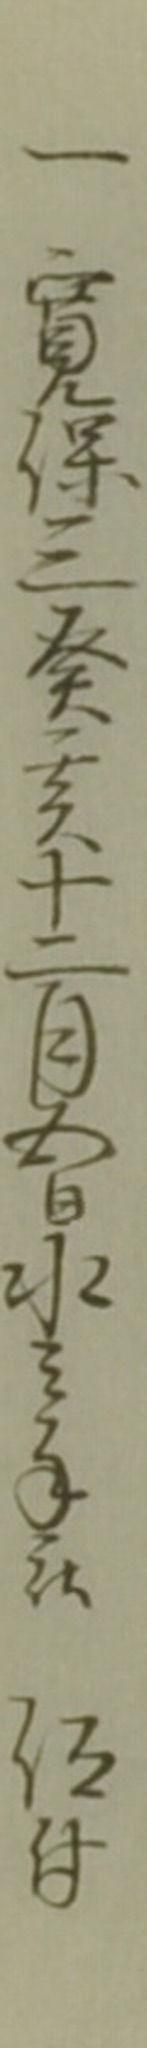一寛保三癸亥十二月五日水主手被仰付
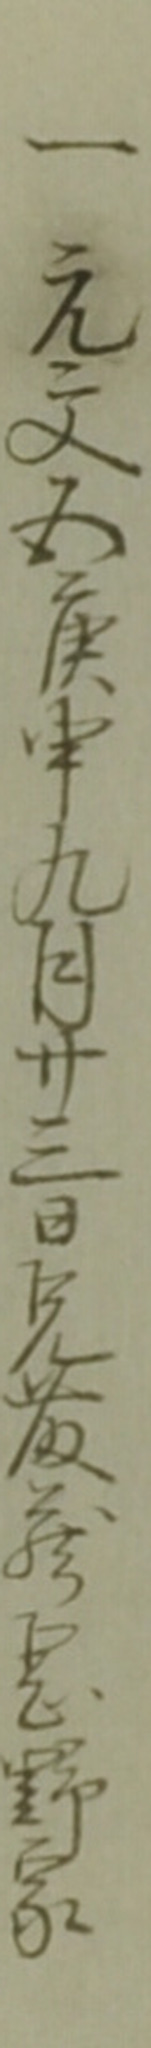一元文五庚申九月廿三日兄藤蔵岡野家
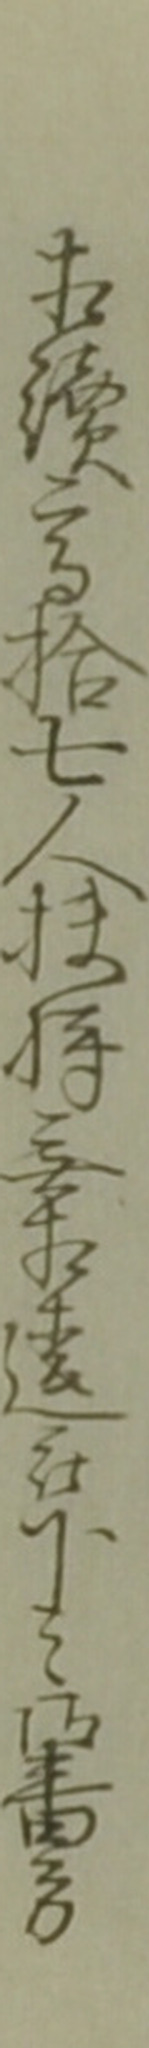相続高拾七人扶持無相違被下候御番方
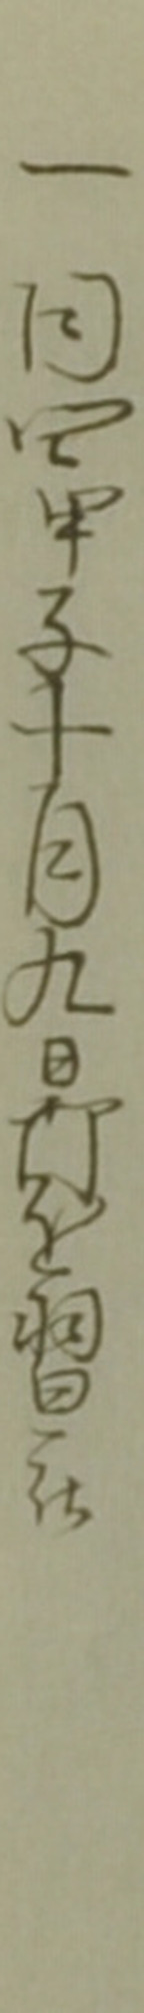一同四甲子十月九日御近習被
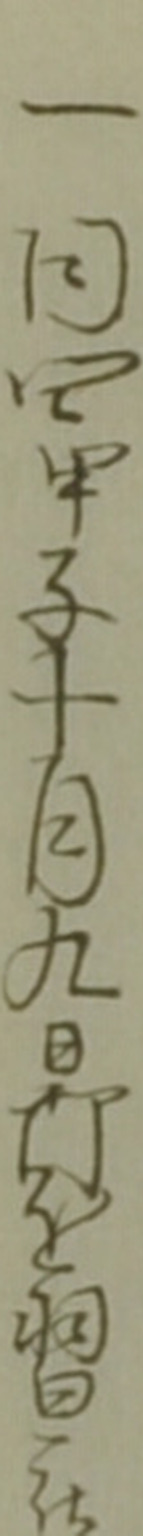一同四甲子十月九日御近習被
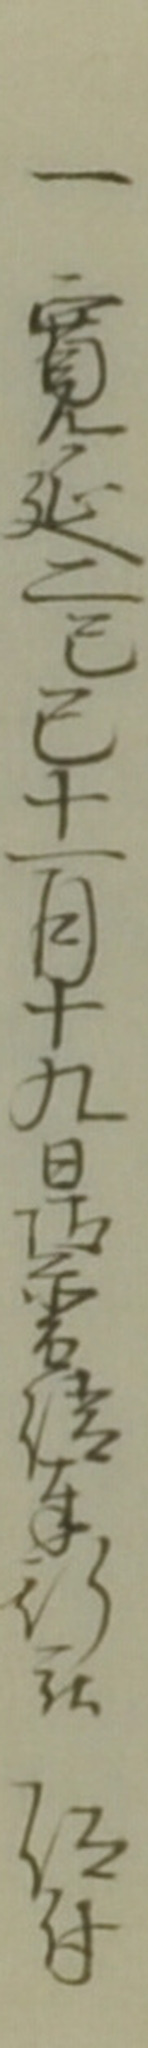一寛延二己巳十一月十九日御普請奉行被仰付
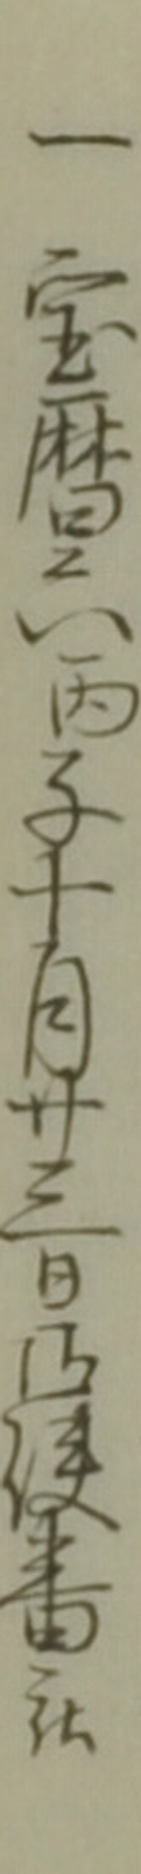一宝暦六丙子十月廿三日御使番被
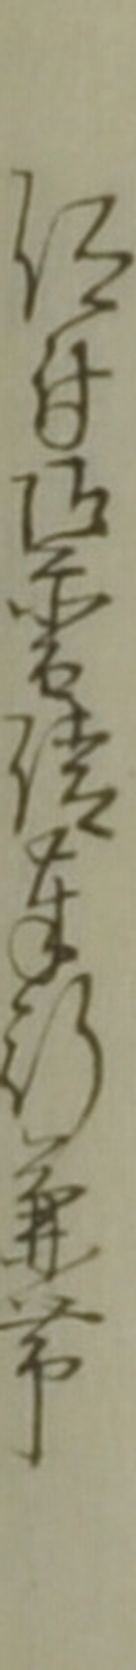仰付御普請奉行兼帯
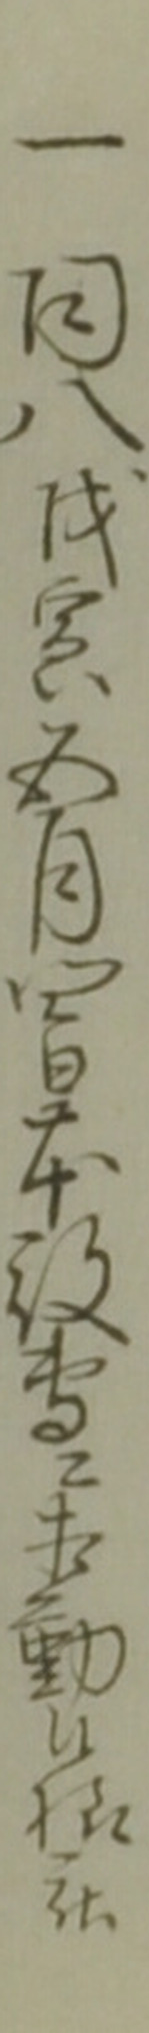一同八戊寅五月四日本役専ニ相勤候様被
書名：給人諸士勤仕録（三）
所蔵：伊那市立高遠町図書館・合同会社AMANE
